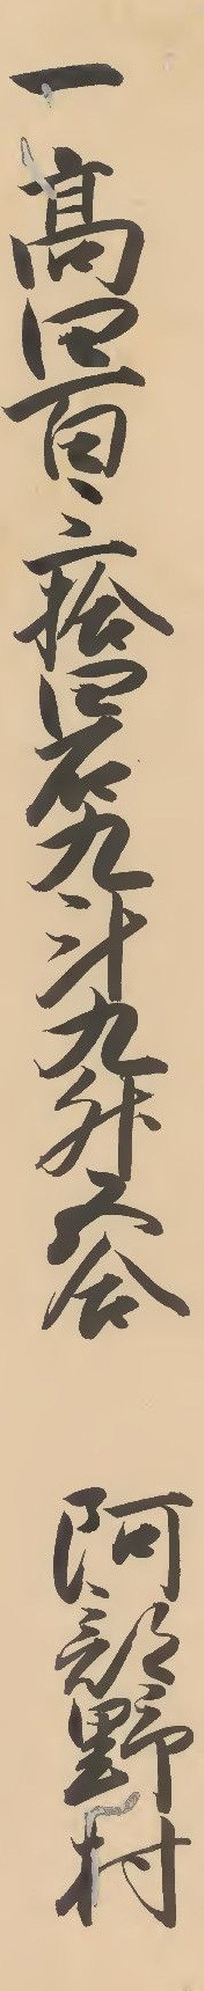一高四百三拾四石九斗九升五合阿部野村
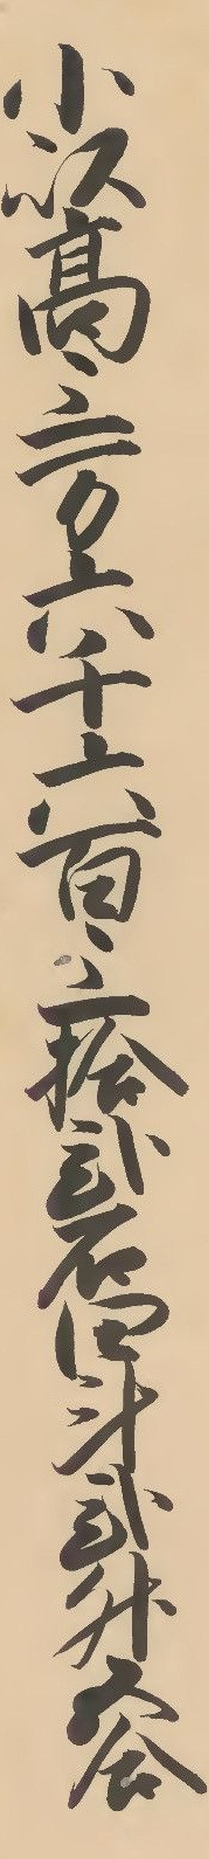小以高三万六千六百三拾弐石四斗弐升五合

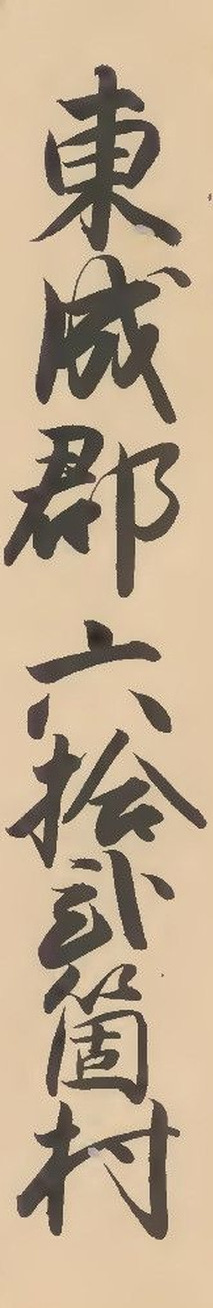東成郡六拾弐箇村
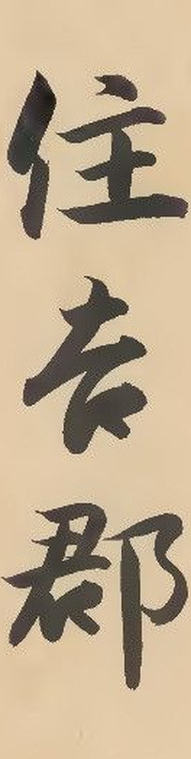住吉郡
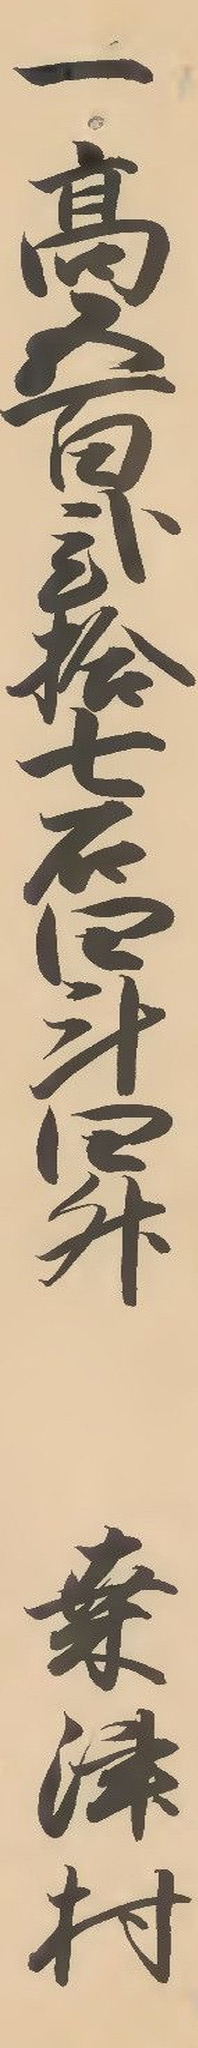一高五百弐拾七石四斗四升桑津村
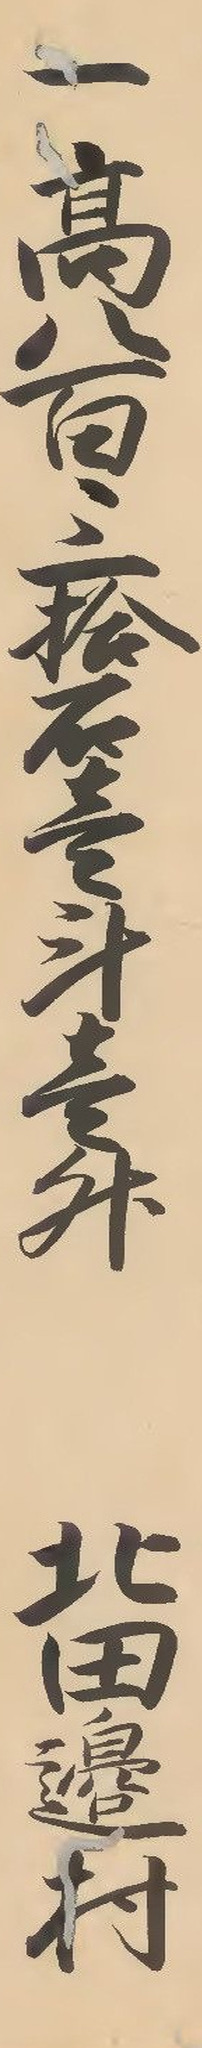一高八百三拾石壱斗壱升北田辺村
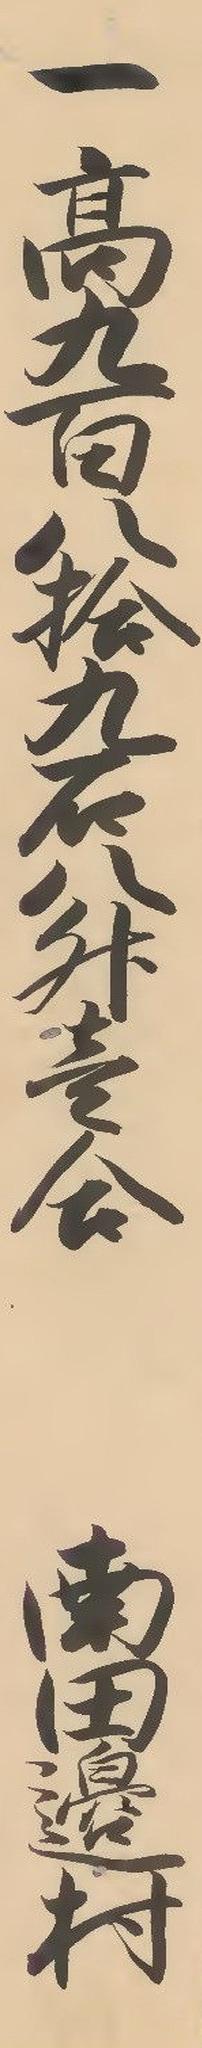一高九百八拾九石八升壱合南田辺村

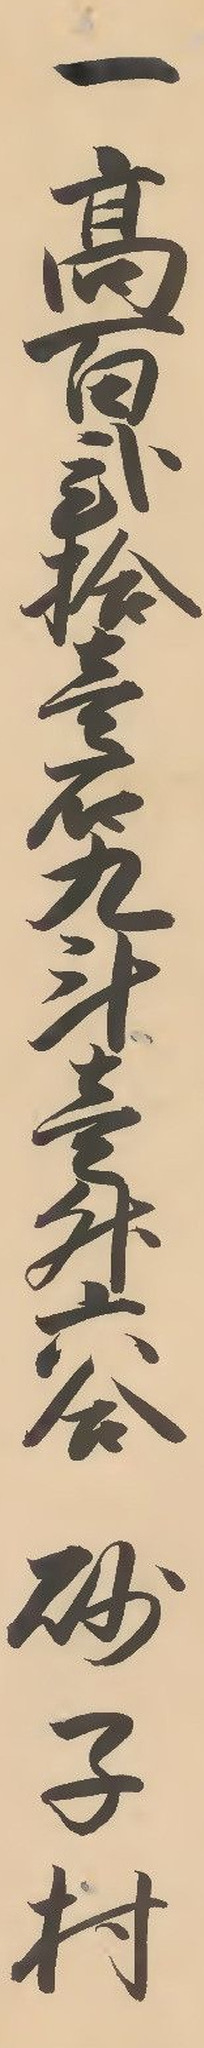一高百弐拾壱石九斗壱升六合砂子村
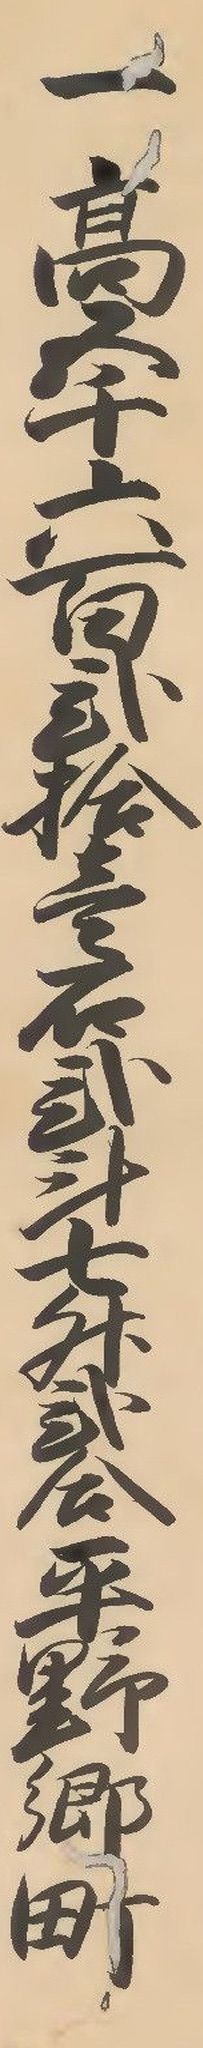一高五千六百弐拾壱石弐斗七升弐合平野郷町
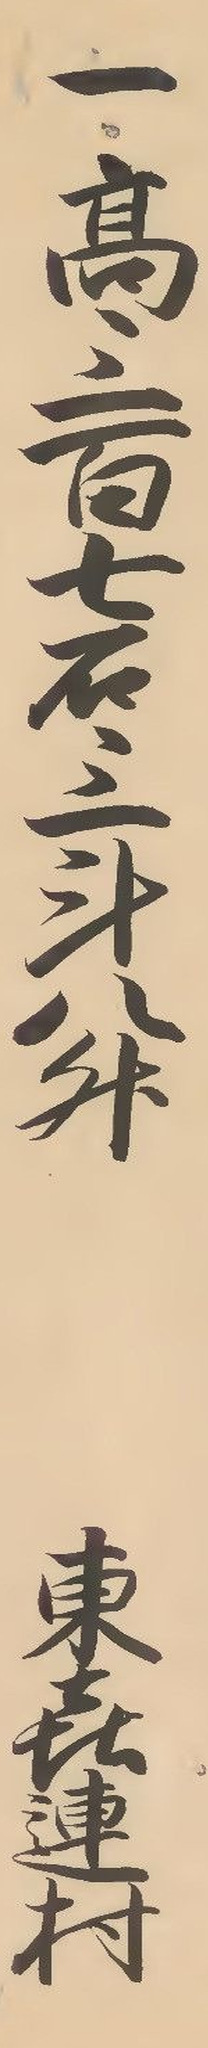一高三百七石三斗八升東喜連村
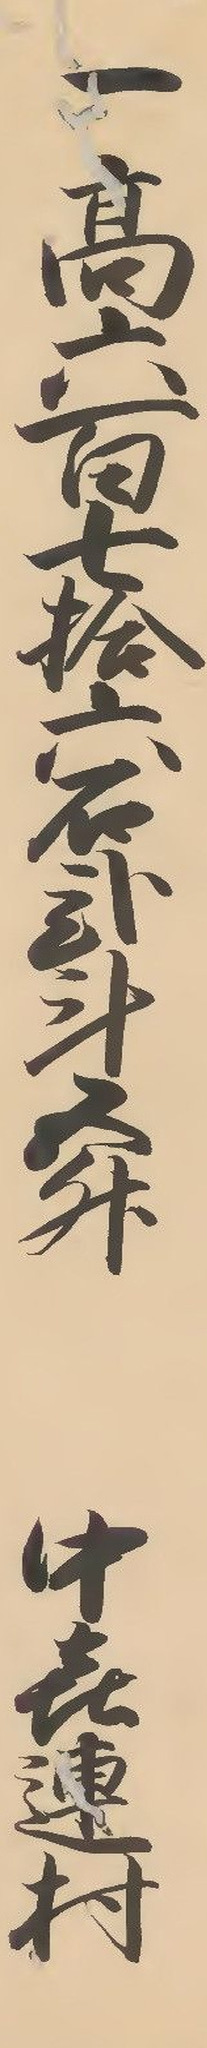一高六百七拾六石弐斗五升中喜連村
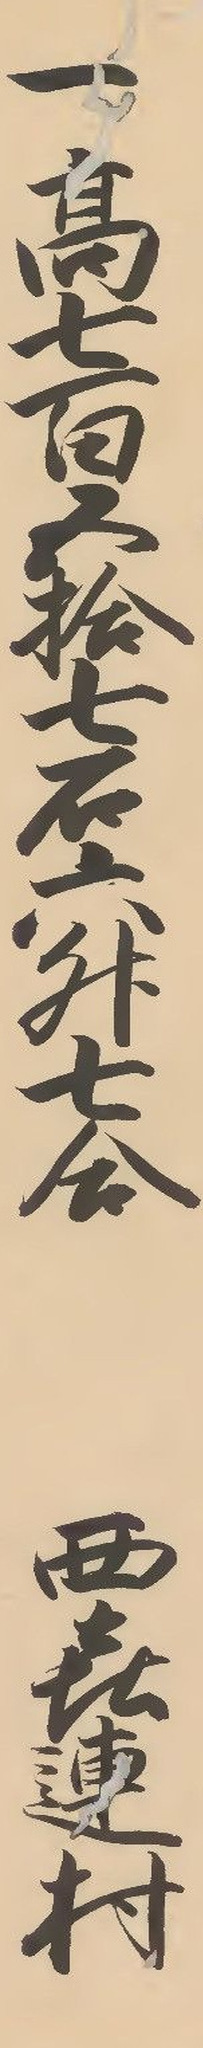一高七百五拾七石六升七合西喜連村
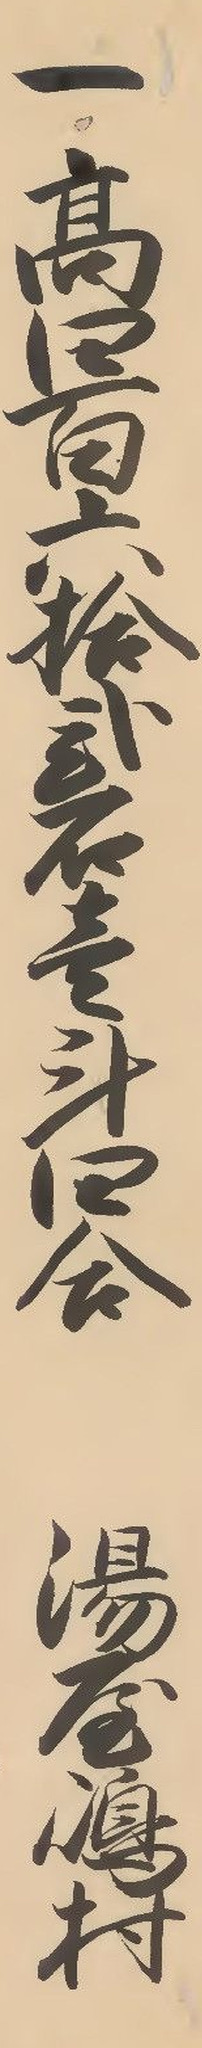一高四百六拾弐石壱斗四合湯屋島村
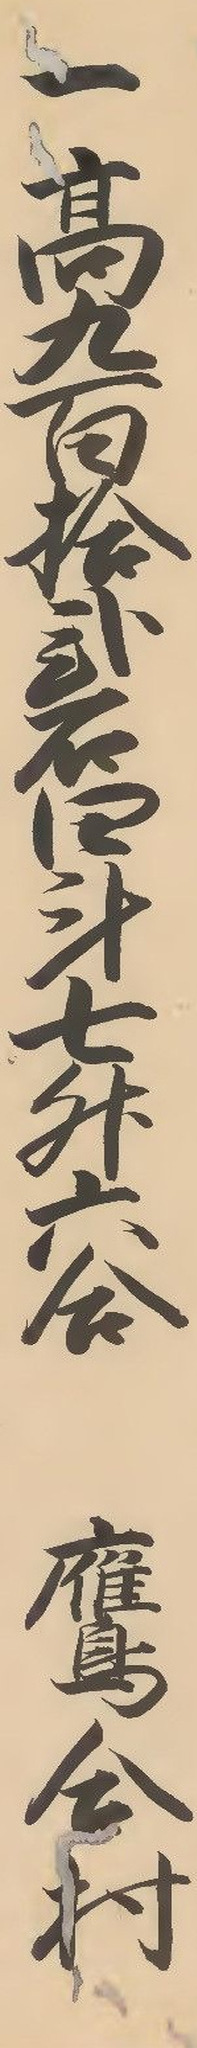一高九百拾弐石四斗七升六合鷹合村
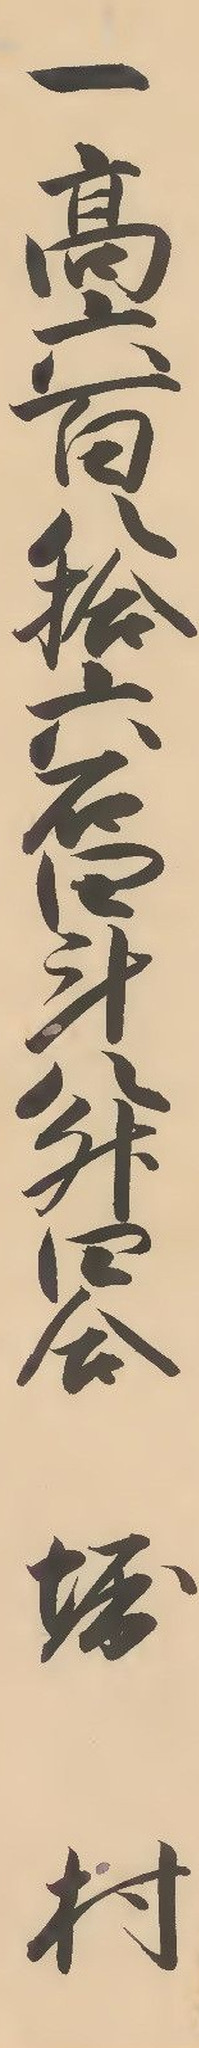一高六百八拾六石四斗八升四合堀村

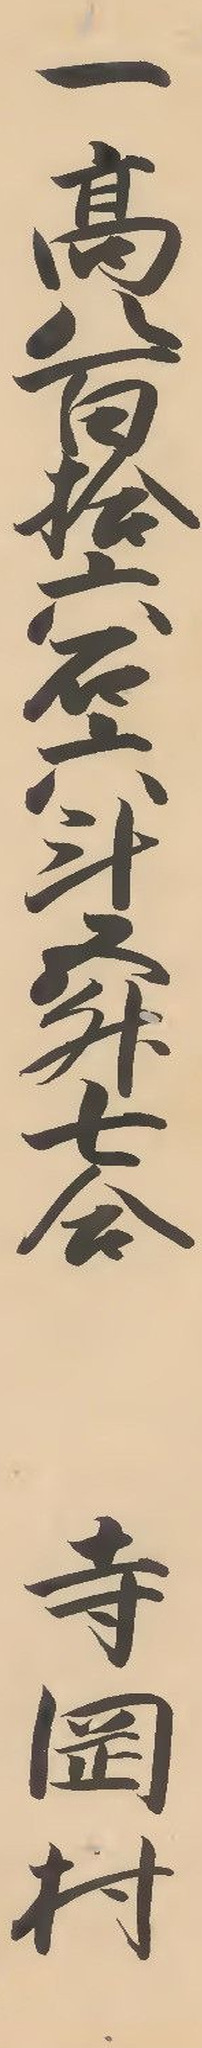一高八百拾六石六斗五升七合寺岡村
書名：摂津国郷帳
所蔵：国立公文書館 National Archives of Japan
